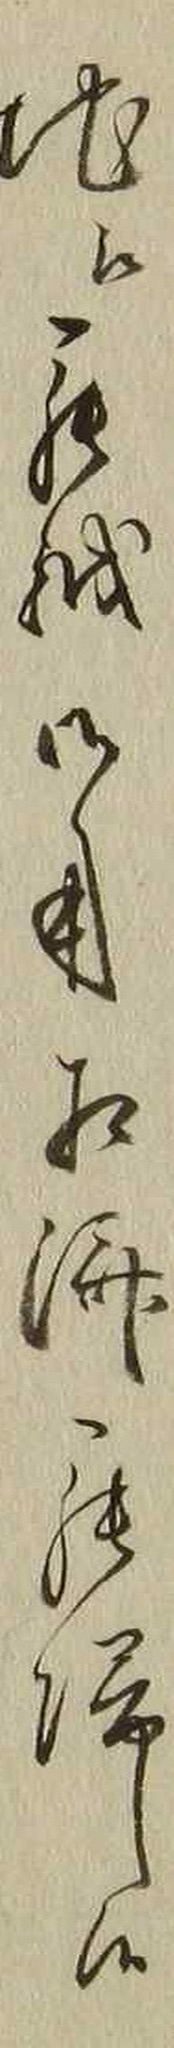地江罷越御用相済罷帰候
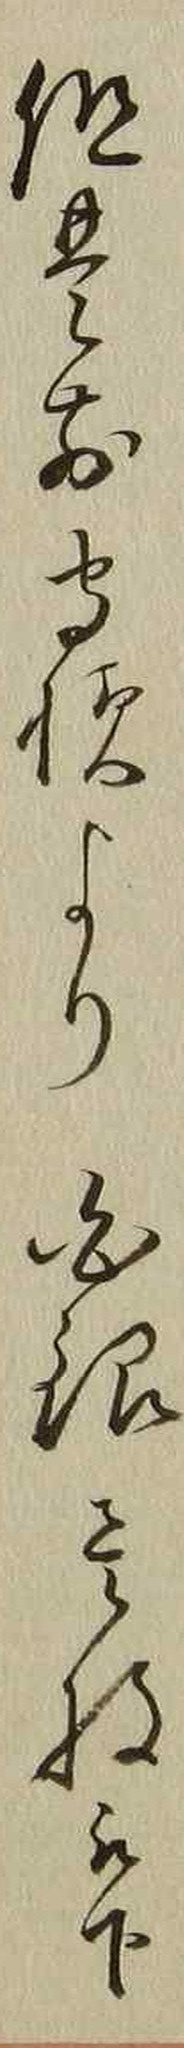但豊前守様より白銀壱枚被下
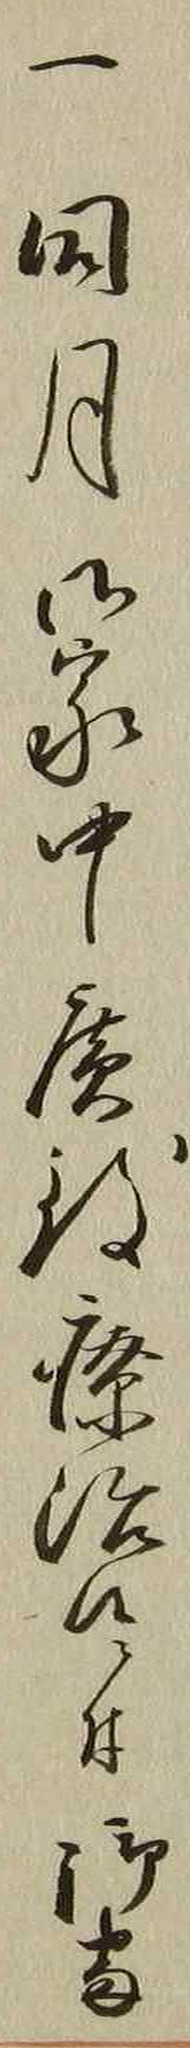一同月御家中広致療治候ニ付御番
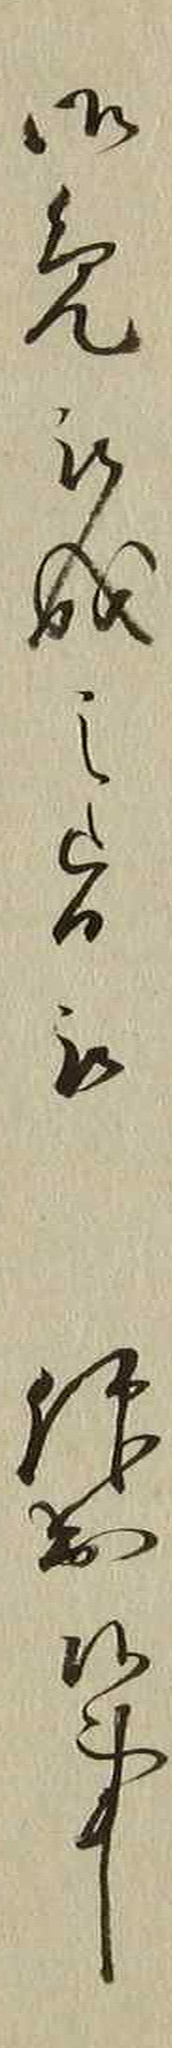御免被成之旨被仰出候事
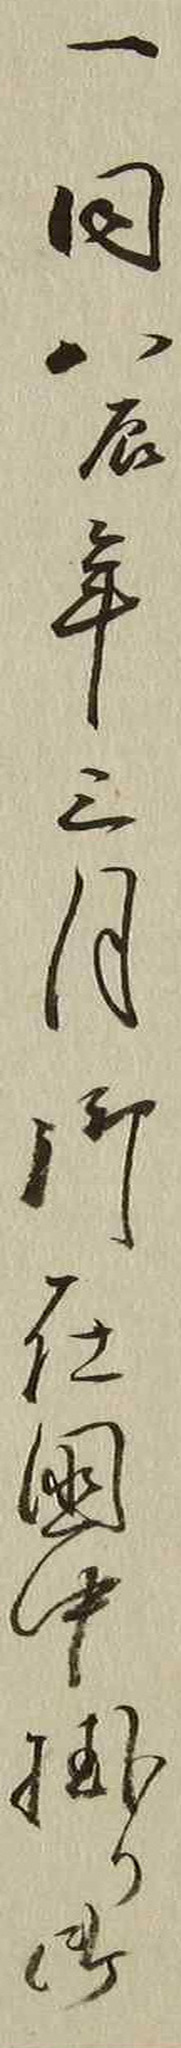一同八辰年三月御在国中掛り御
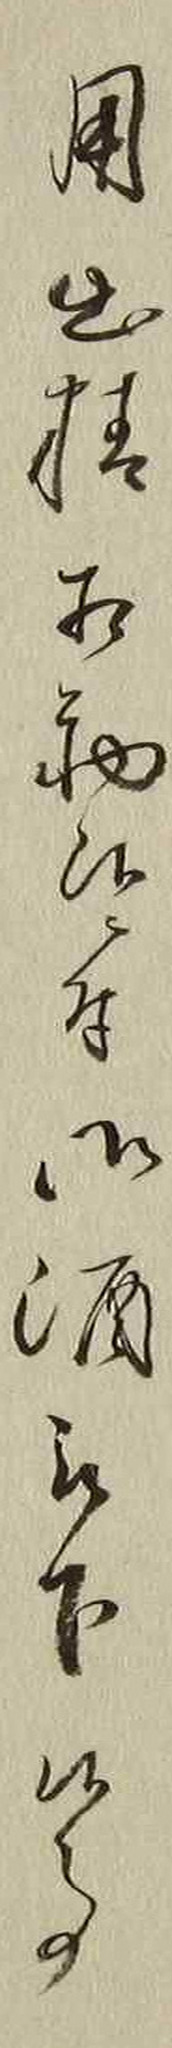用出精相勤候ニ付御酒被下候事
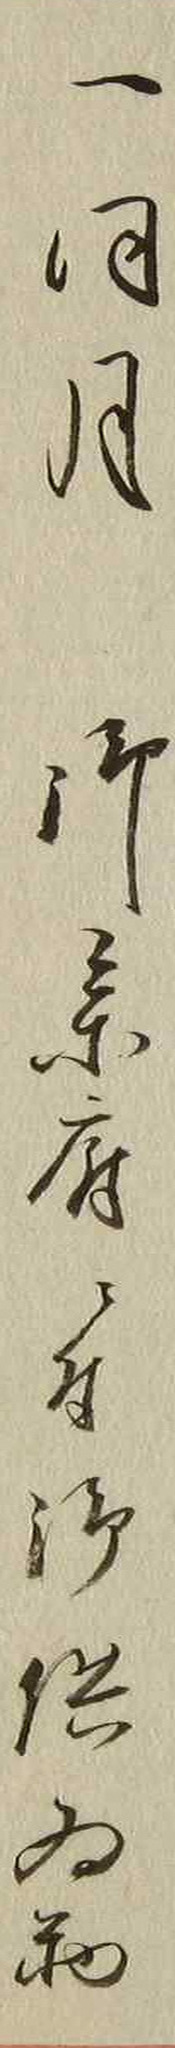一同月御参府ニ付御供為勤
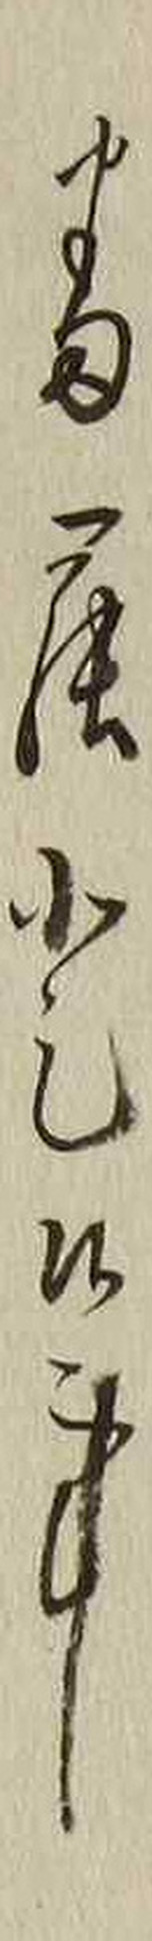番罷登候事
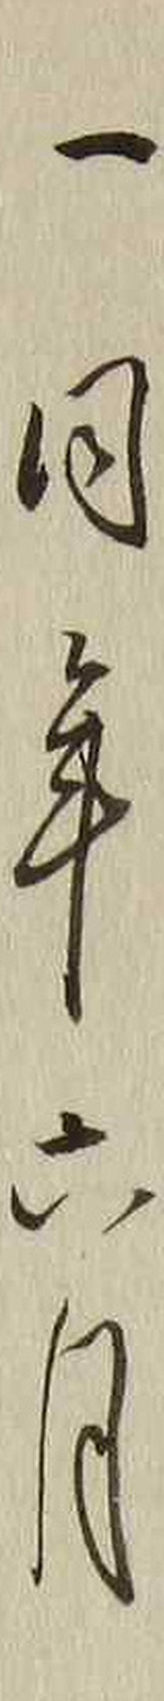一同年六月
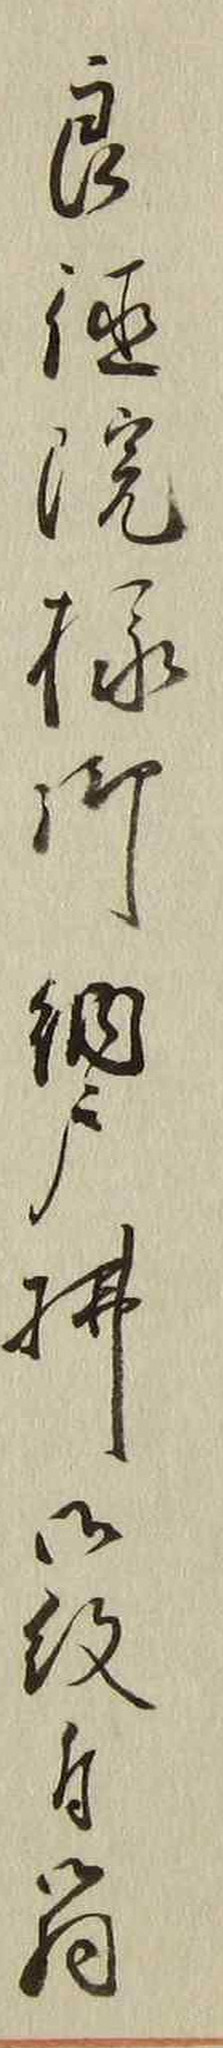良徳院様御納戸払御紋付御羽
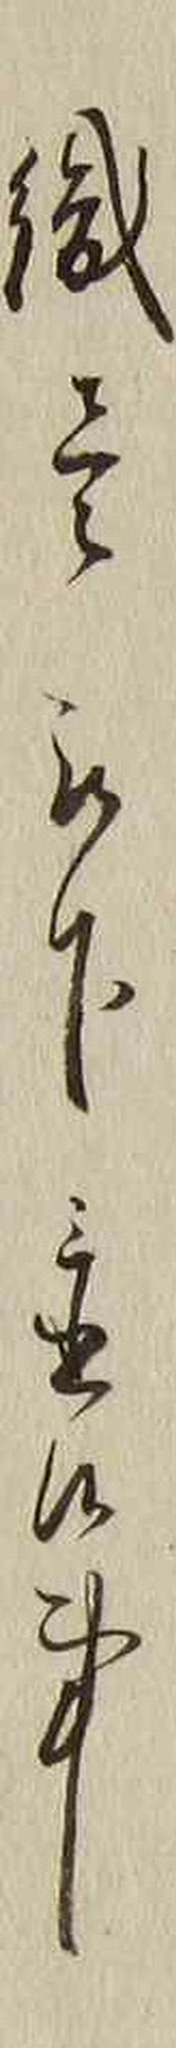織壱被下置候事
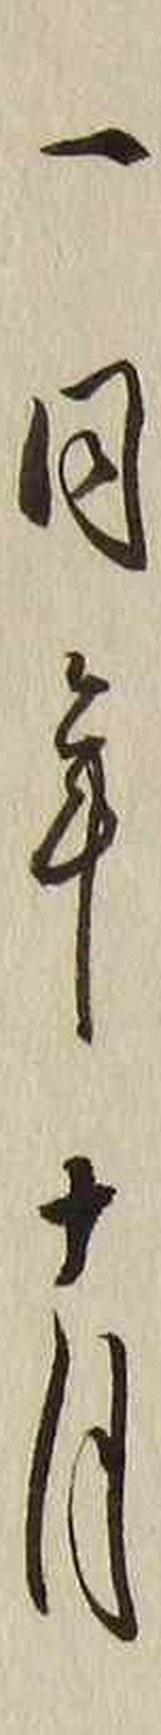一同年十月
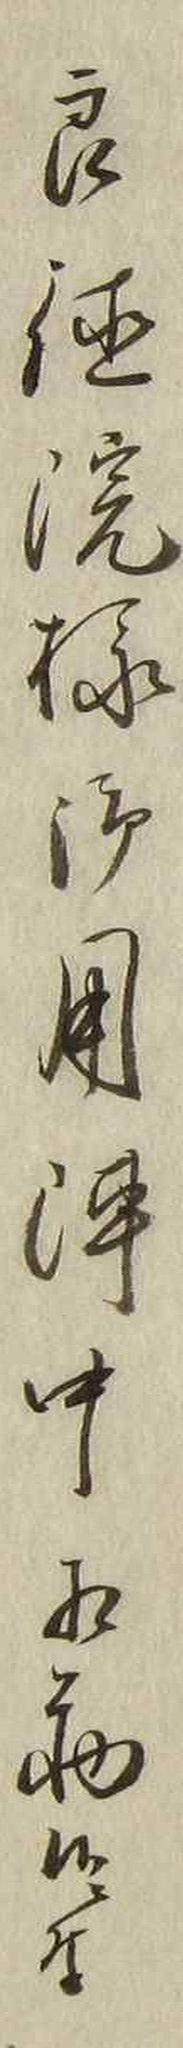良徳院様御用陣中相勤候ニ付
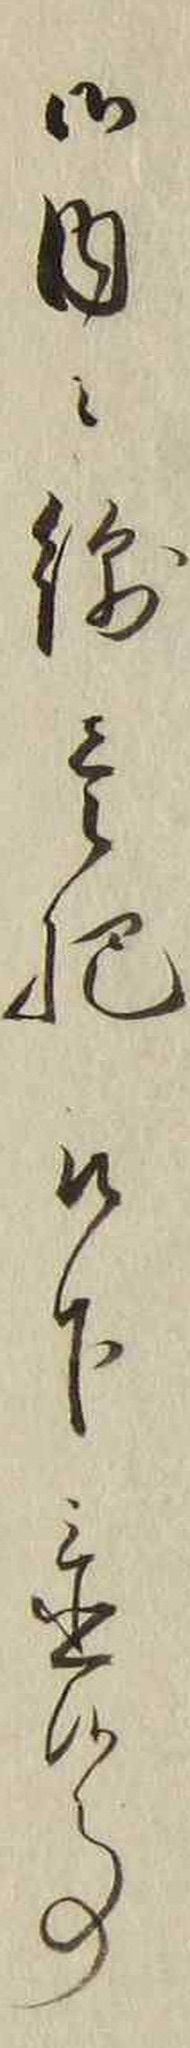御内々綿壱把被下置候事

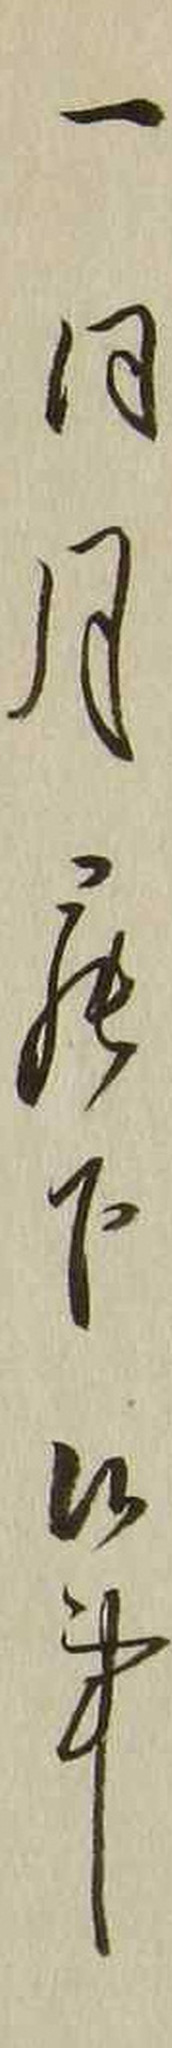一同月罷下候事
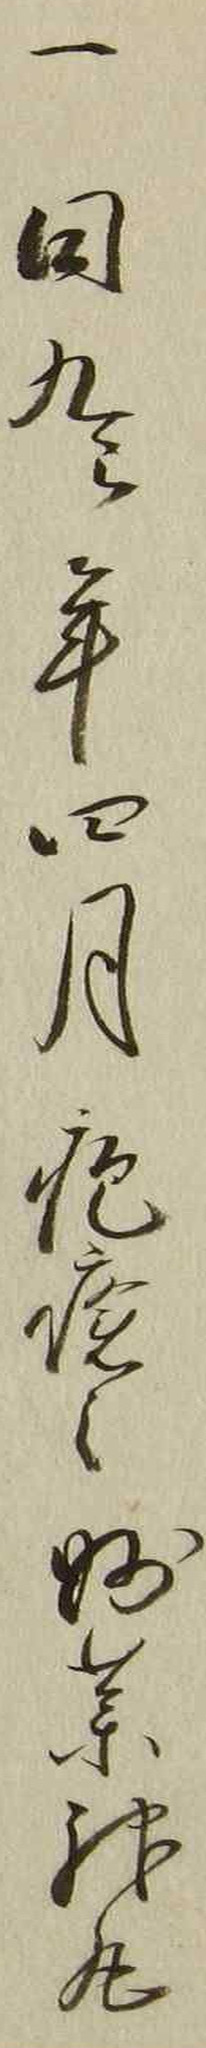一同九巳年四月疱瘡之妙薬神丸
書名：諸士系譜　巻之68　を之部2
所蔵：会津若松市立会津図書館
